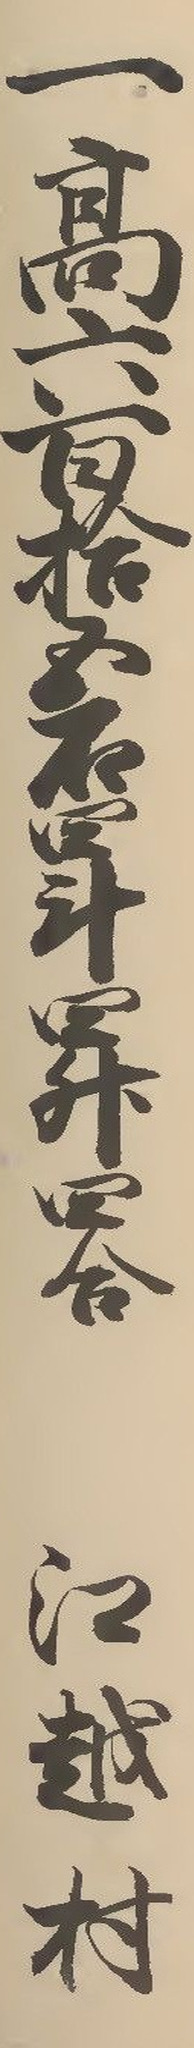一髙六百拾五石四斗四升四合江越村
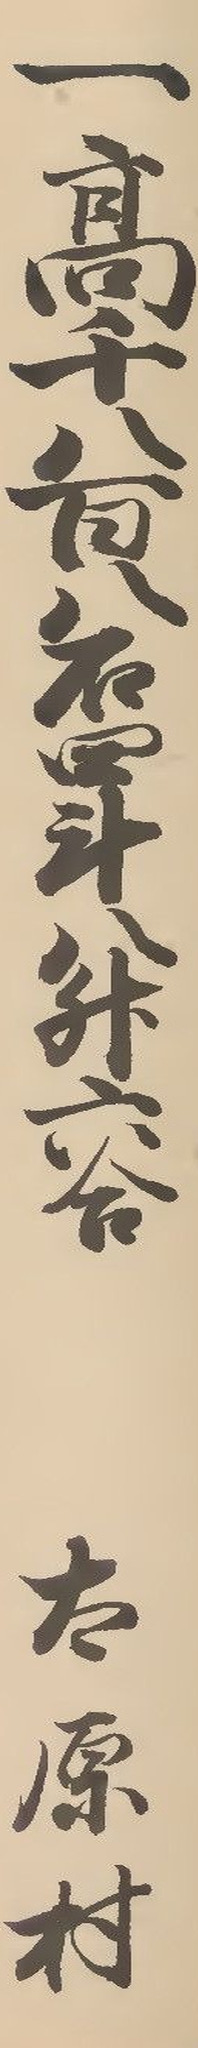一髙千八百八石四斗八升六合太原村
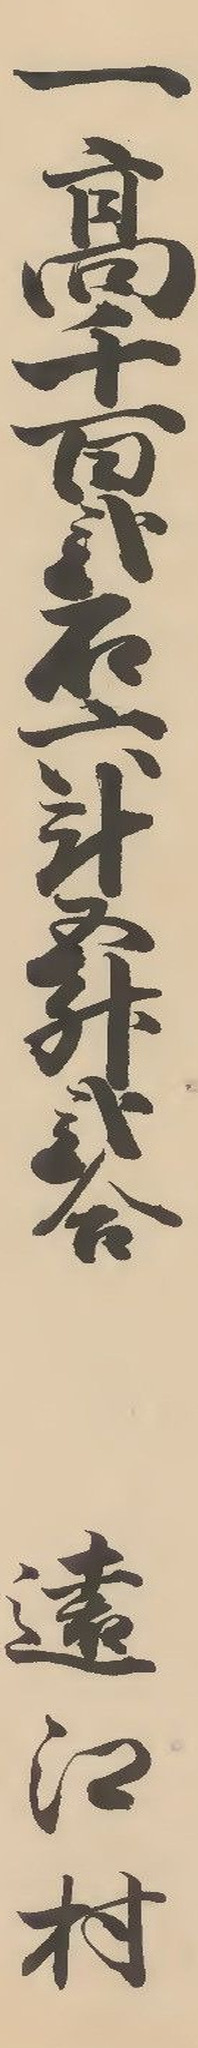一髙千百弐石六斗五升弐合遠江村
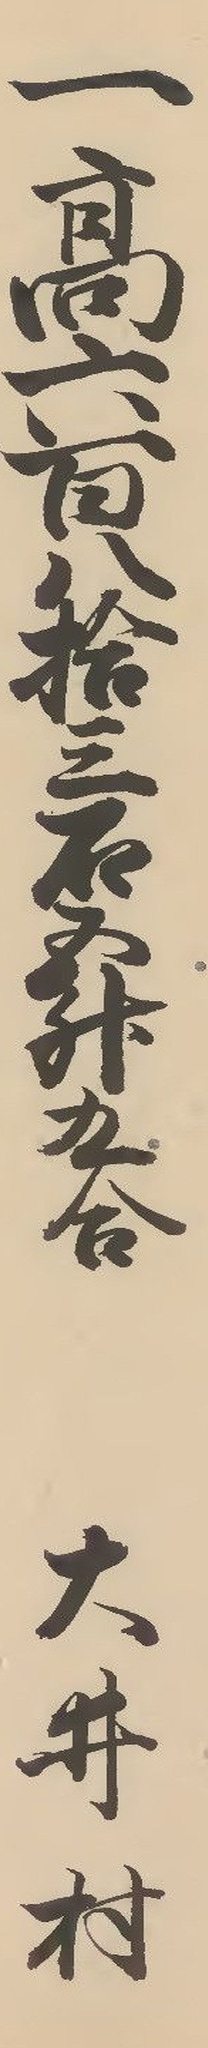一髙六百八拾三石五升九合大井村
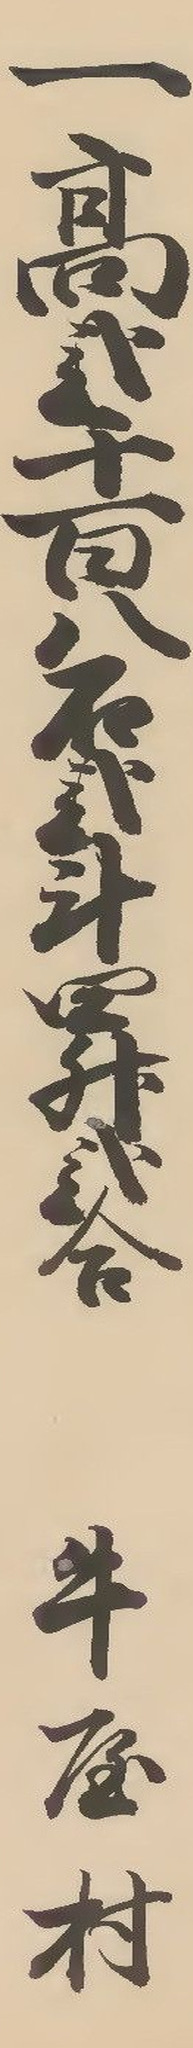一髙弐千百八石弐斗四升弐合牛屋村

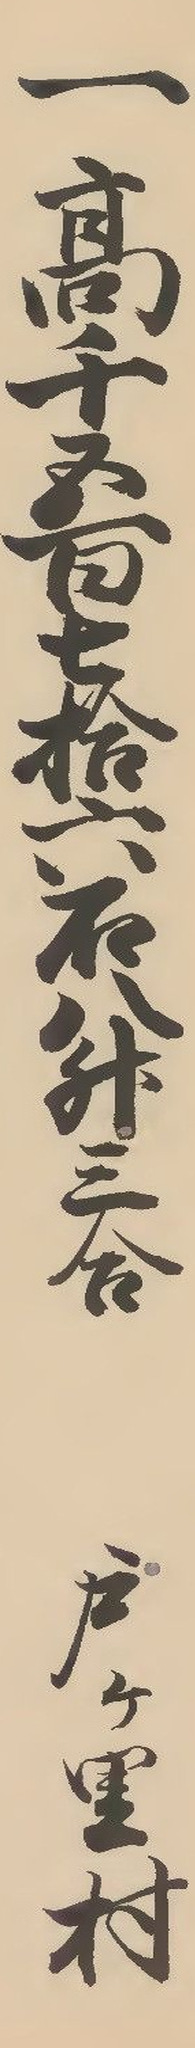一髙千五百七拾六石八升三合戸ケ里村
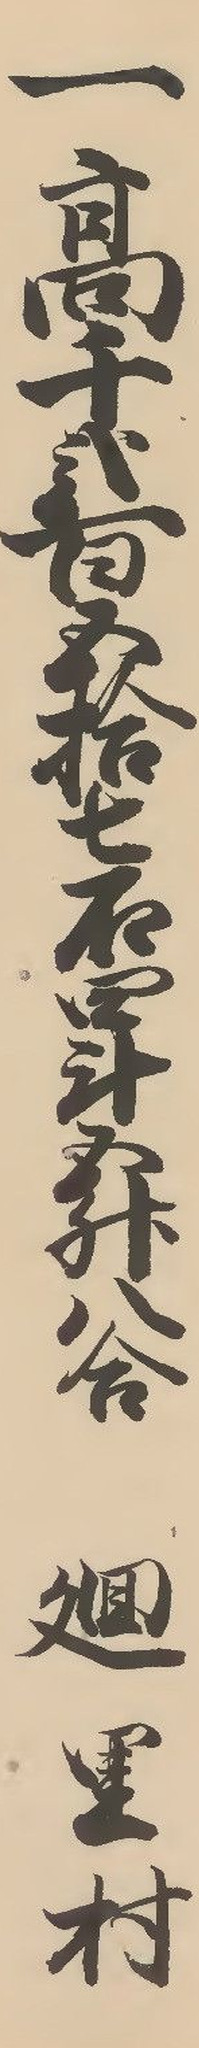一髙千弐百五拾七石四斗五升八合廻里村
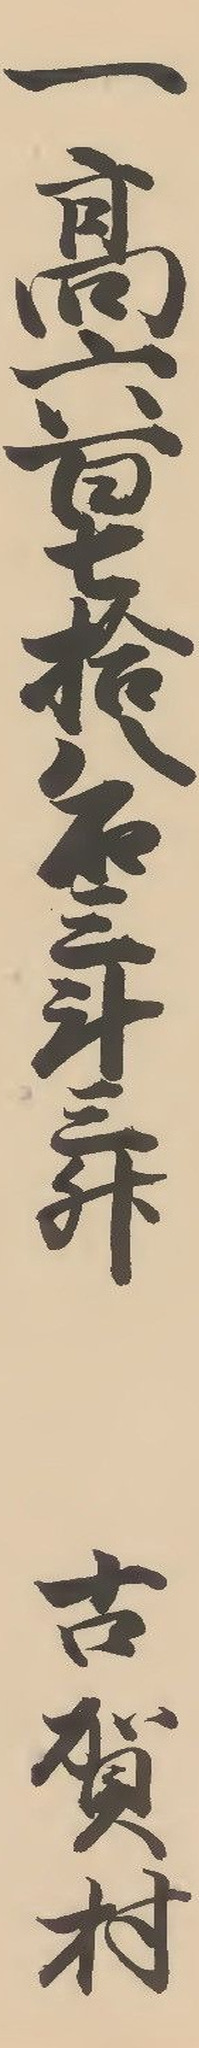一髙六百七拾八石三斗三升古賀村
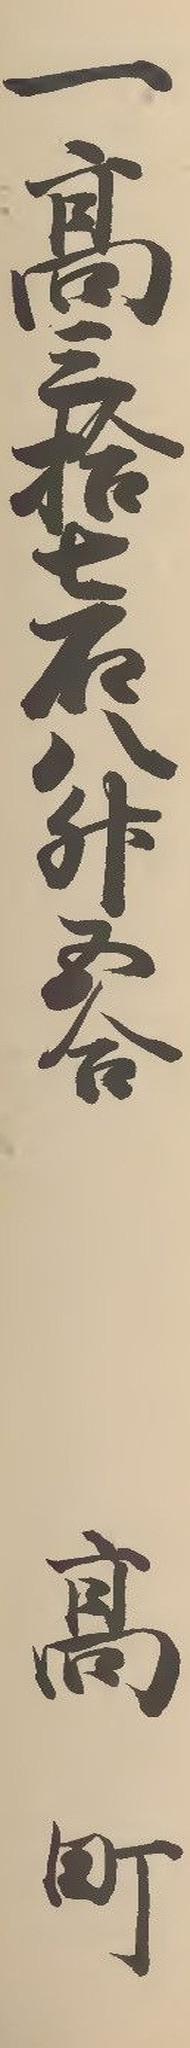一髙三拾七石八升五合髙町
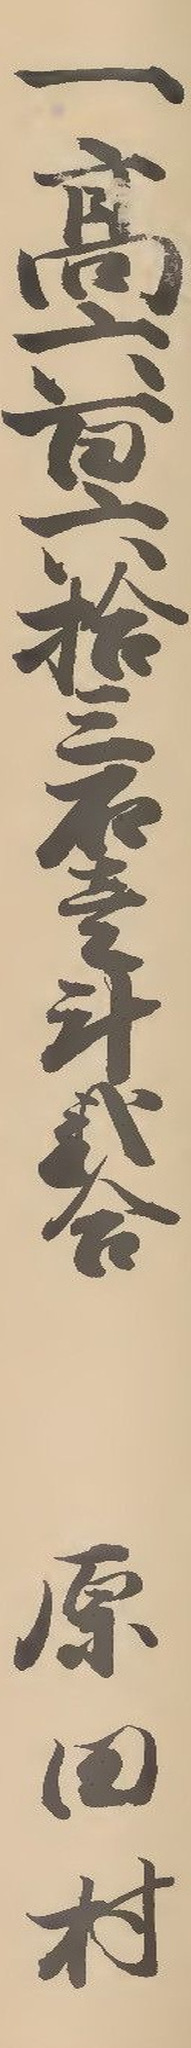一髙六百六拾三石壱斗弐合原田村
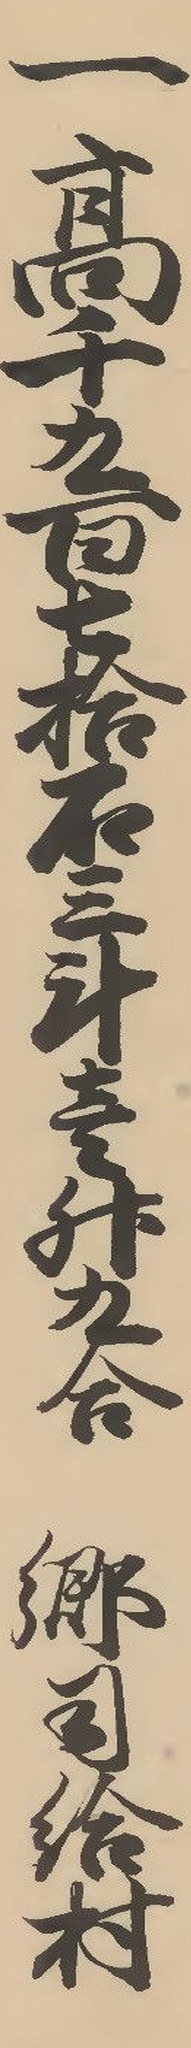一髙千九百七拾石三斗壱升九合郷司給村
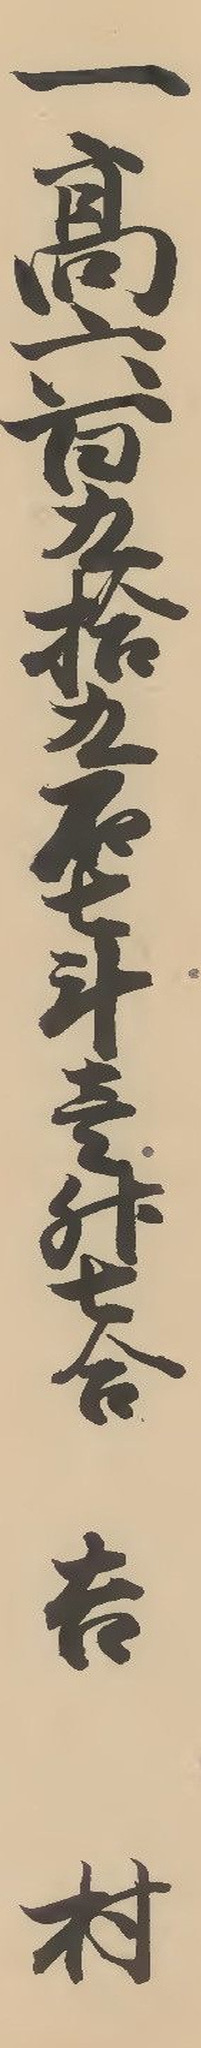一髙六百九拾九石七斗壱升七合吉村
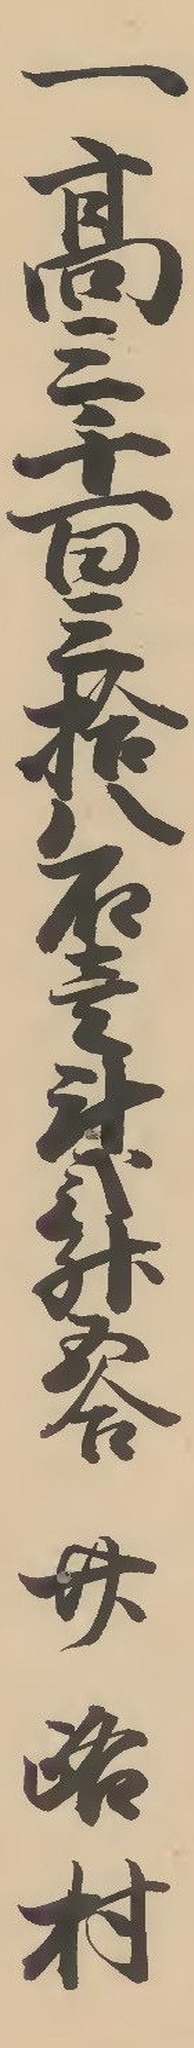一髙三千百三拾八石壱斗壱升五合廿路村

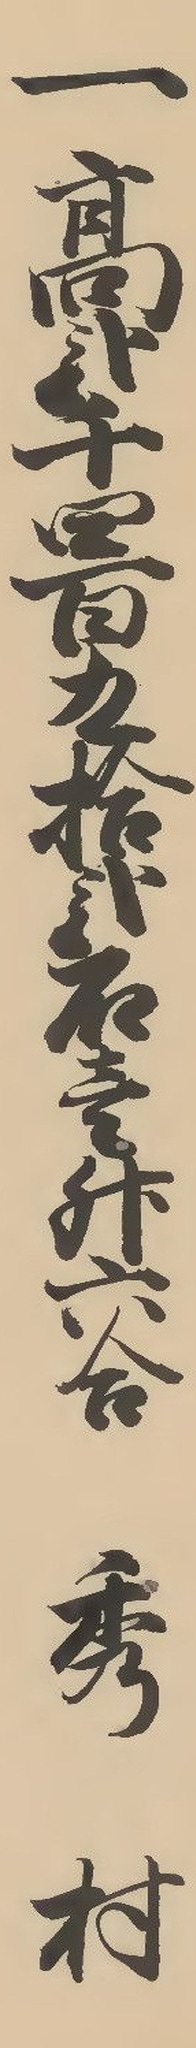一髙弐千四百九拾弐石壱升六合秀村
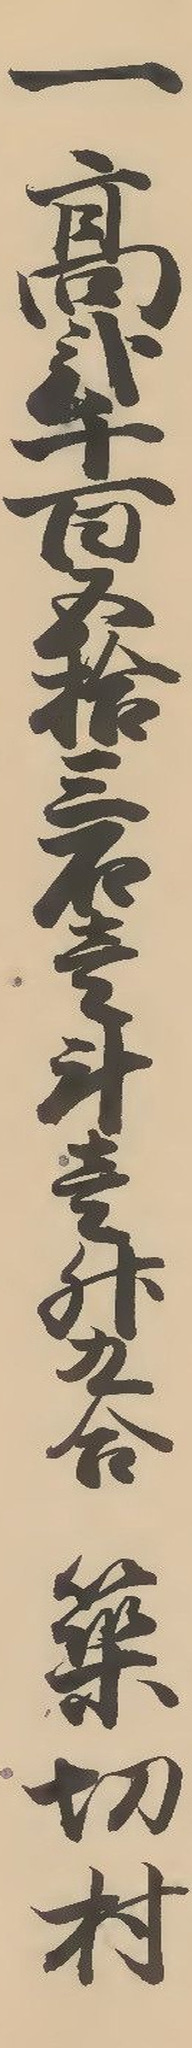一髙弐千百五拾三石壱斗壱升九合切村
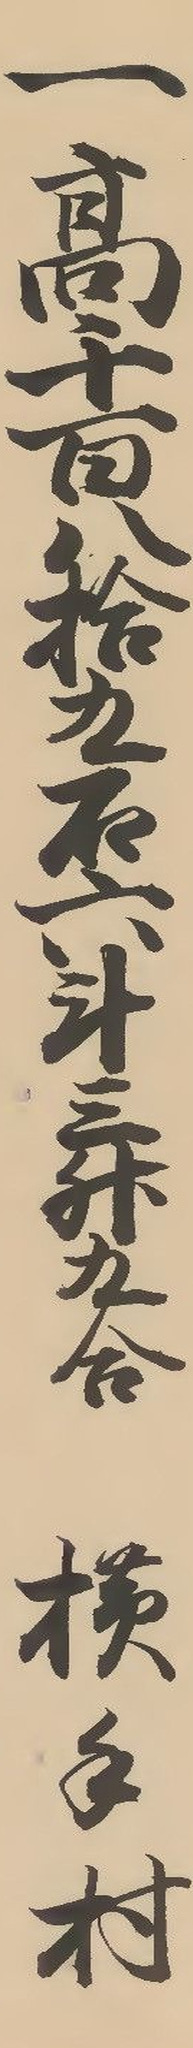一髙千百八拾九石六斗三升九合横手村
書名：肥前国郷帳
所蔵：国立公文書館 National Archives of Japan
